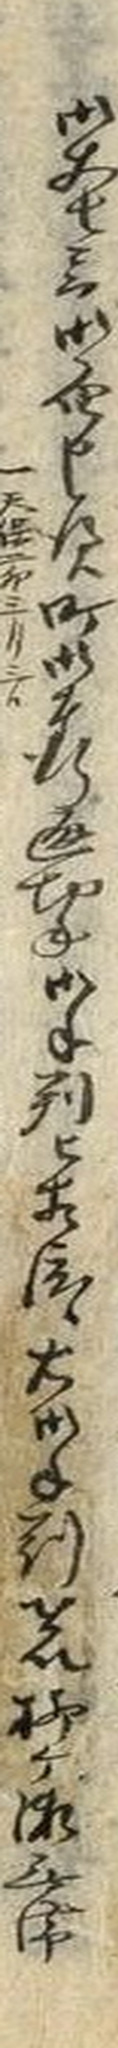御使者ニ而御届申候得ハ町御奉行通切手御手判被相渡候右御手判を以柳ケ瀬無滞
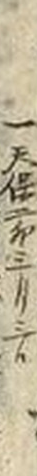一天保二卯三月三日
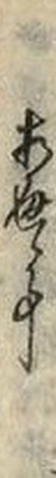相通候事
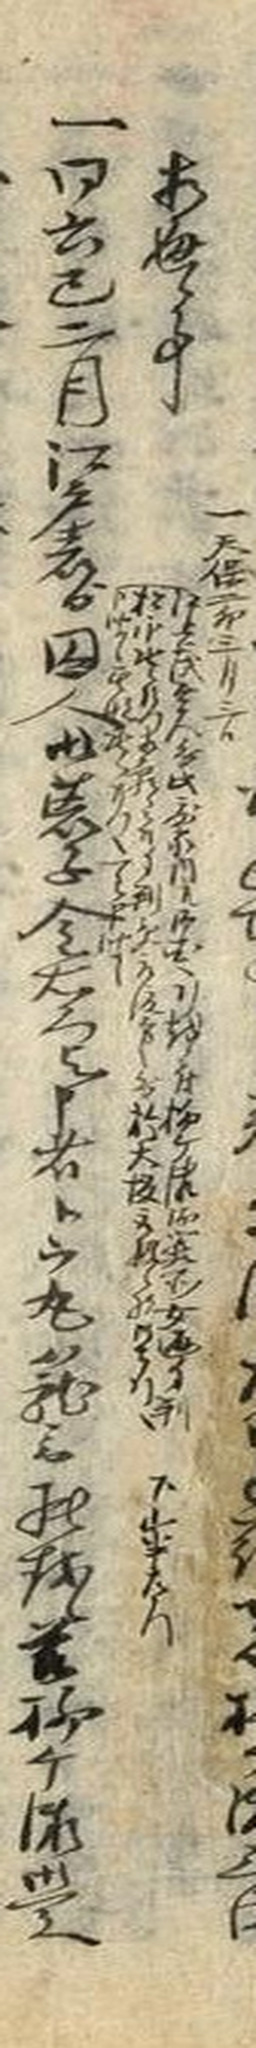一同六巳二月江戸表ゟ囚人御荒子金右衛門与申者トウ丸籠ニ而罷越候節柳ケ瀬御関
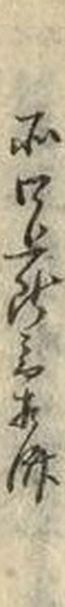所口上断ニ而相済
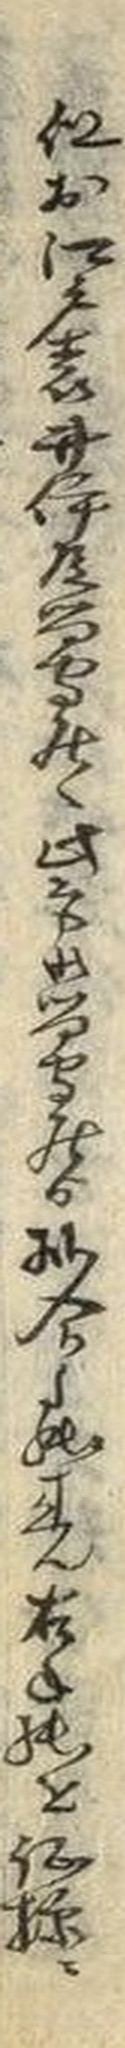但於江戸表井伊殿留守居へ此方御留守居ゟ掛合ニ罷来ル右手紙を証標ニ
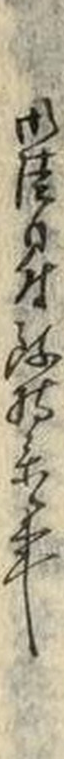御徒目付致持参候事
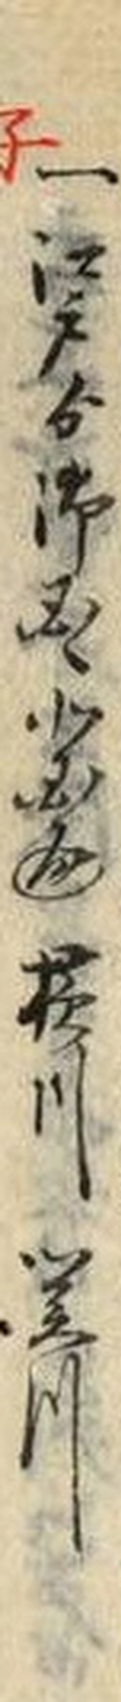一江戸ゟ御国へ北国通横川関川

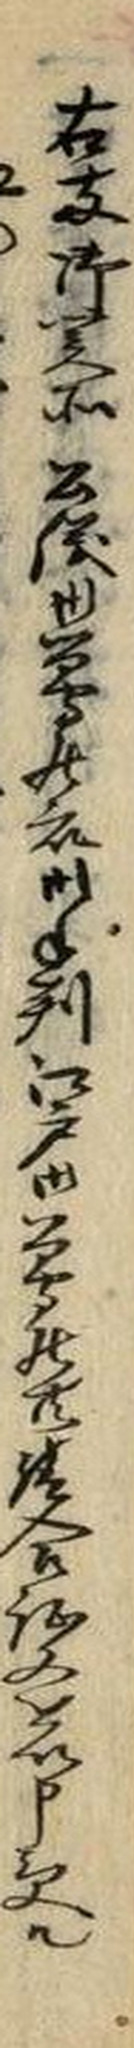右両御関所公儀御留守居衆御手判江戸御留守居共請合証文を以申受ル
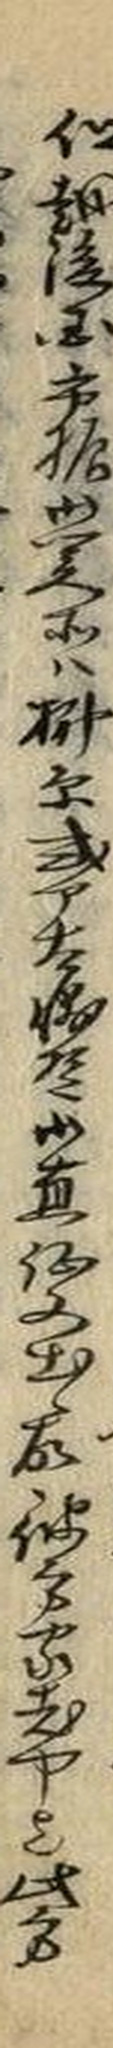但越後国市振御関所ハ榊原式部大輔殿御直証文出候故彼方家老中迄此方
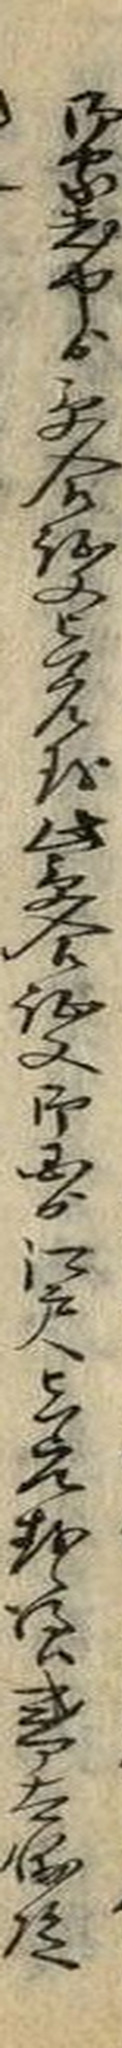御家老中ゟ受合証文被差越此受合証文御国ゟ江戸へ被差越候得ハ式部大輔殿
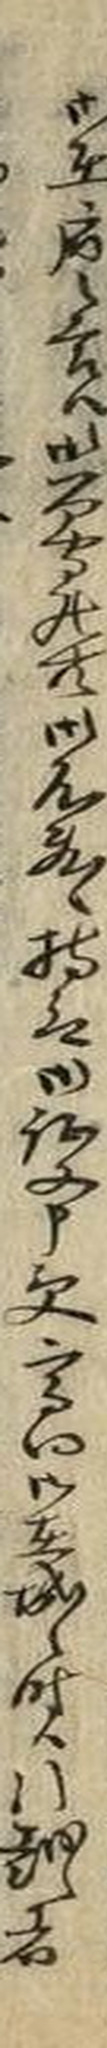御在府之節ハ御留守居共御屋敷へ持参御証文申受高田御候在城之節ハ引越候者
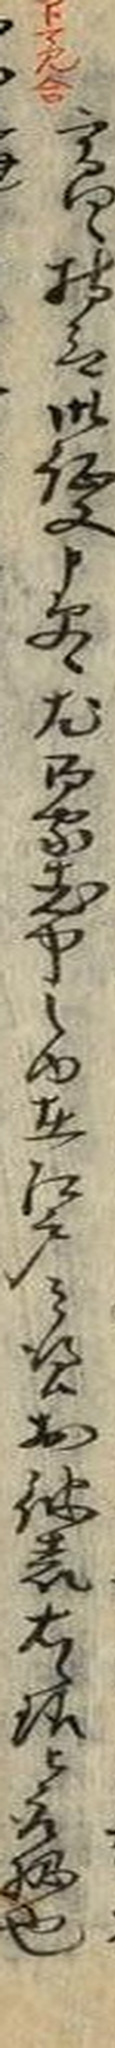高田へ持参御証文申受候尤御家老中之内在江戸ニ候得ハ於彼表右之趣被取扱也
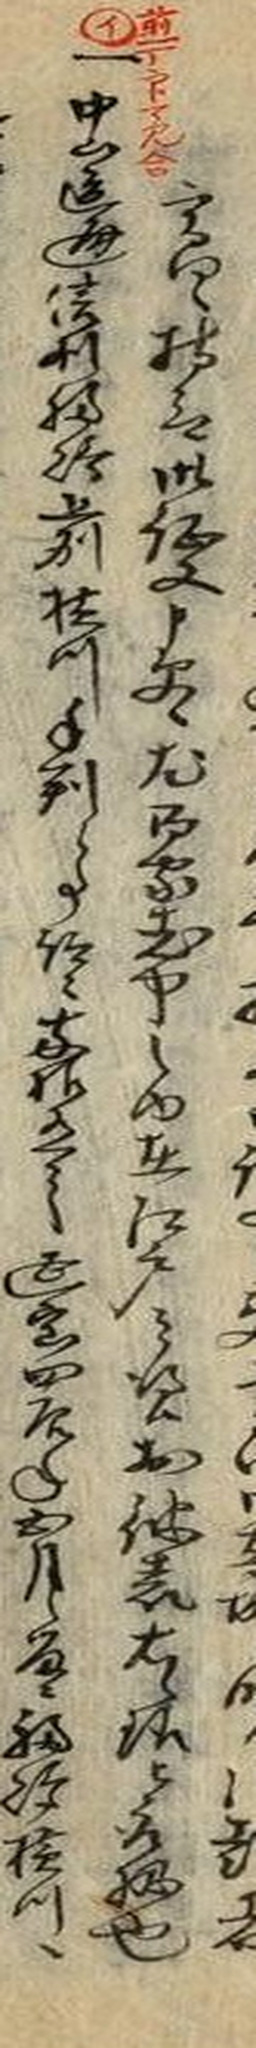一中山道通信州福嶋上州横川手判之事跡々両様有之延宝四辰年五月之留ニ福嶋横川へ
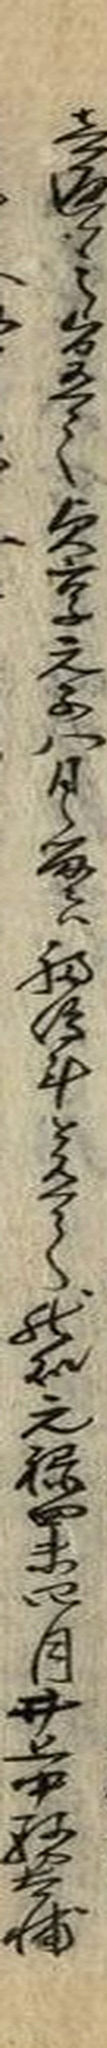壱通ツヽ之旨有之貞享元子八月之留ニハ福嶋斗と有之然処元禄四未四月井上中務大輔
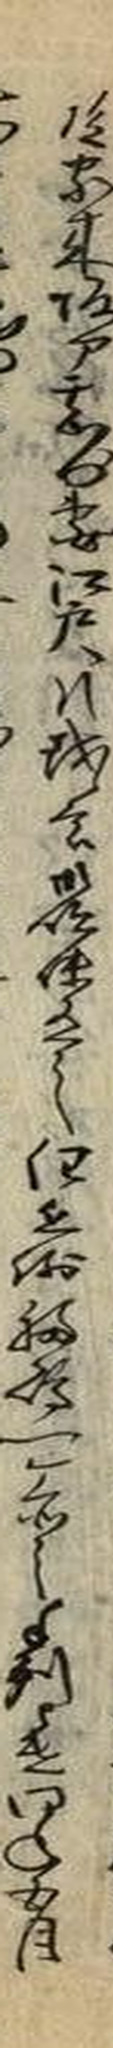殿家来坂部甚右衛門妻江戸へ引越候節御吟味有之任近例福嶋一ケ所之手判被遣同年五月
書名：御国他国諸事之部
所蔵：福井県文書館 Fukui Prefectural Archives
